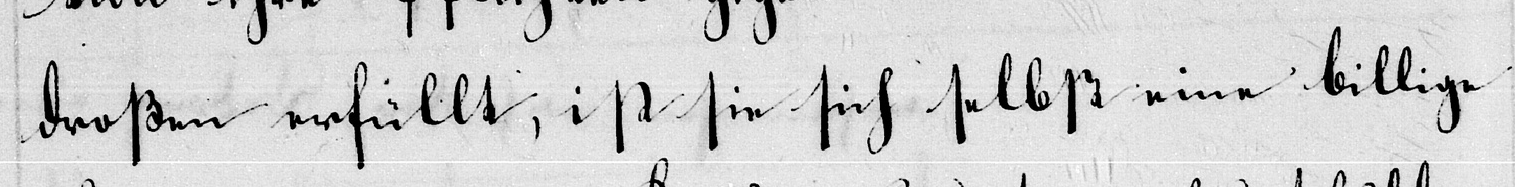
droßen erfüllt, ist sie sich selbst eine billige
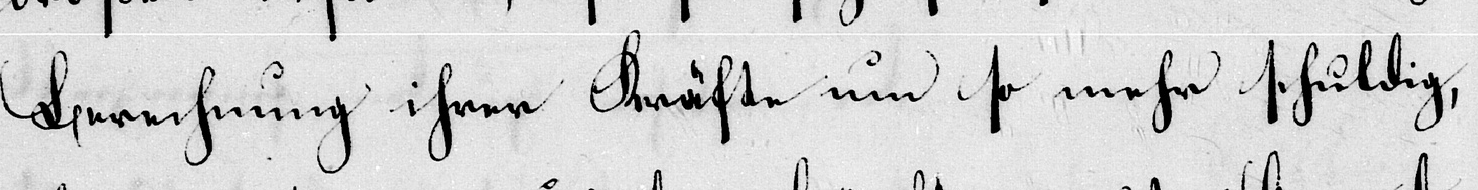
Berechnung ihrer Kräfte um so mehr schuldig,
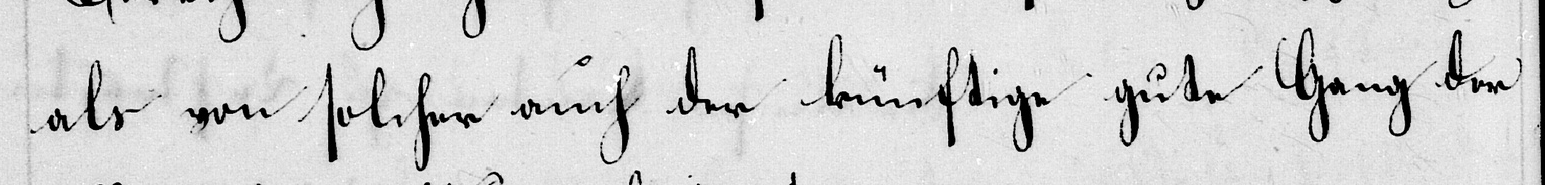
als von solcher auch der künftige gute Gang der
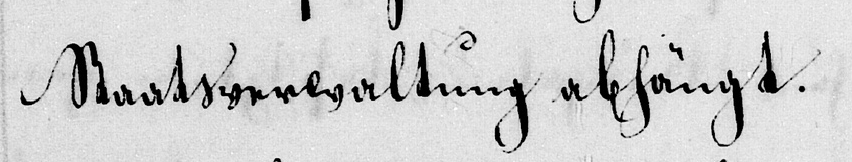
Staatsverwaltung abhängt.
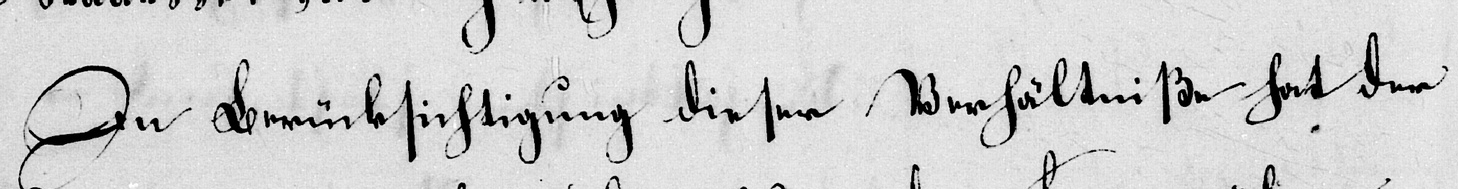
In Berücksichtigung dieser Verhältniße hat der
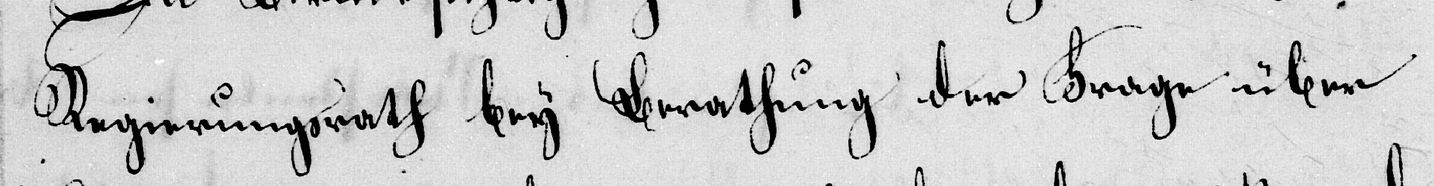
Regierungsrath bey Berathung der Frage über
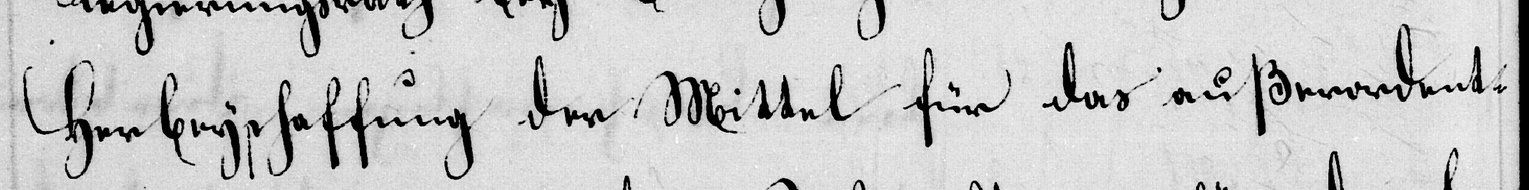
Herbeyschaffung der Mittel für das außerordent¬
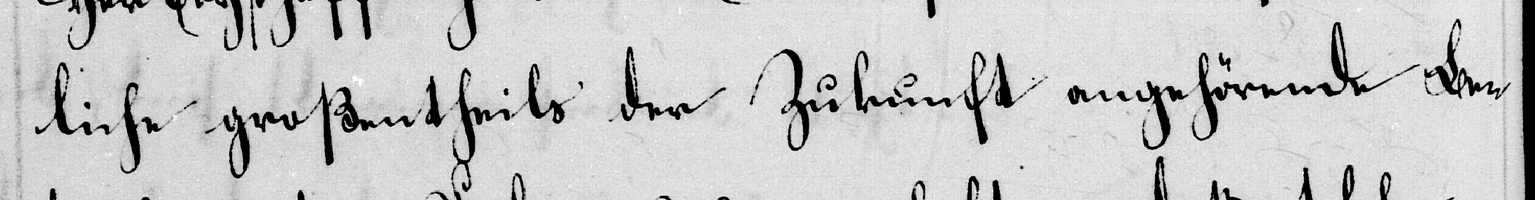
liche großentheils der Zukunft angehörende Be¬
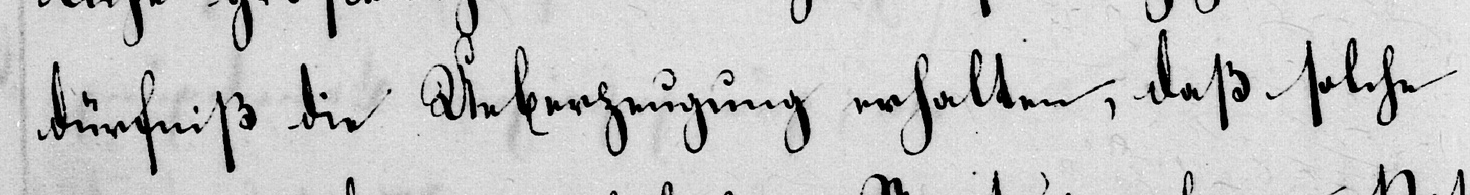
dürfniß die Ueberzeugung erhalten, daß solche
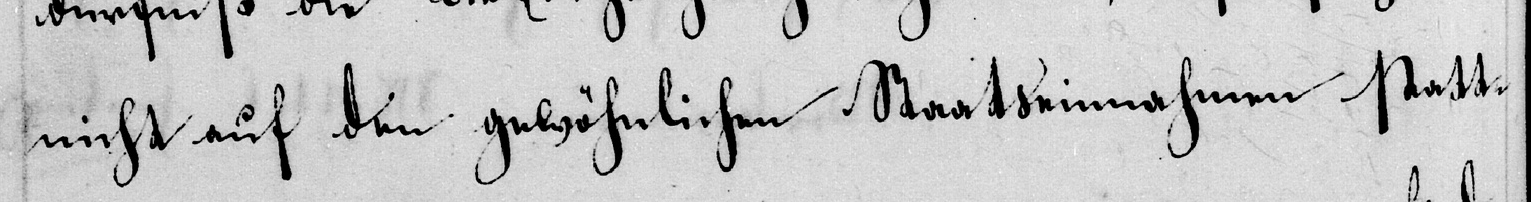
nicht auf den gewöhnlichen Staatseinnahmen statt-
